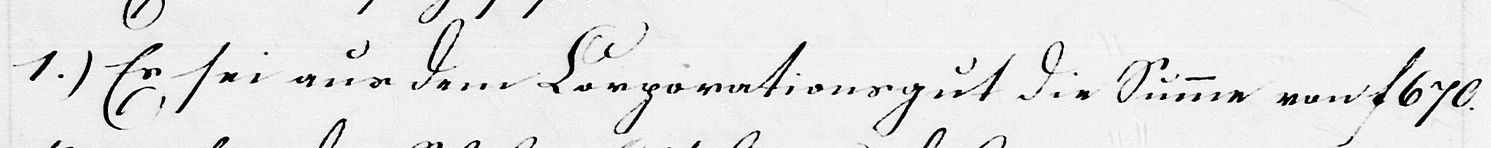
1.) Es sei aus dem Corporationsgut die Summe von f 670.
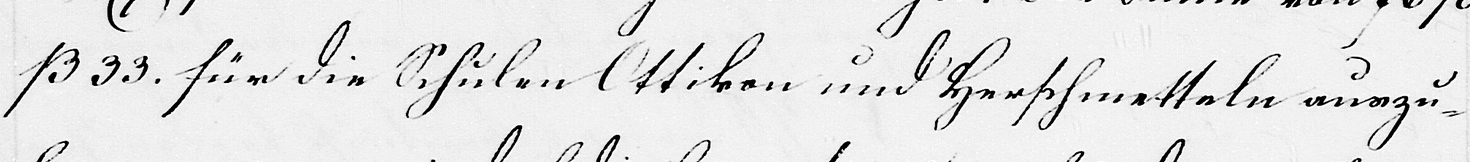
ß 33. für die Schulen Ottikon und Herschmetteln auszu¬
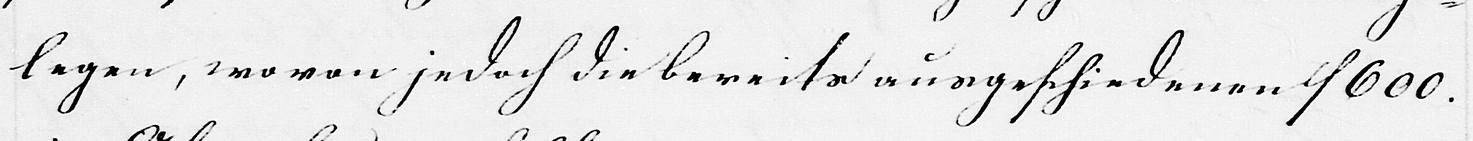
legen, wovon jedoch die bereits ausgeschiedenen f 600.
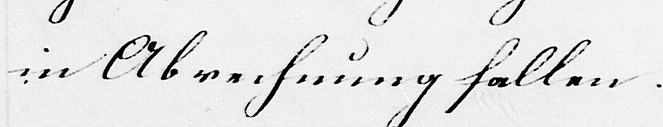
in Abrechnung fallen.
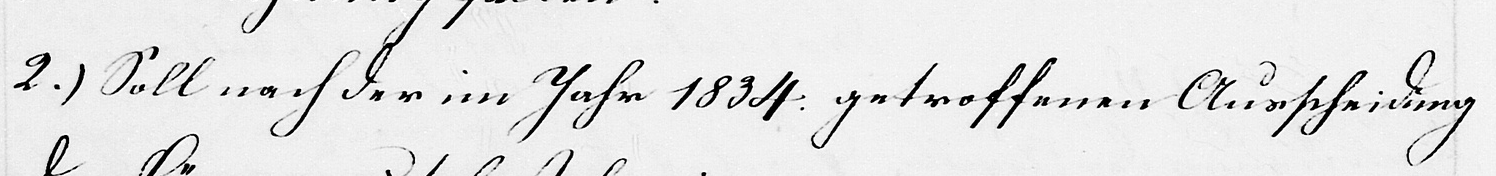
2.) Soll nach der im Jahr 1834. getroffenen Ausscheidung
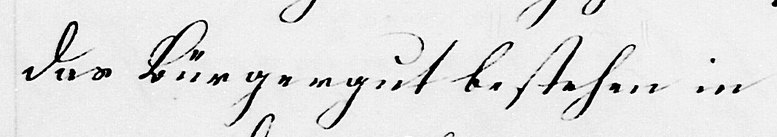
das Bürgergut bestehen in
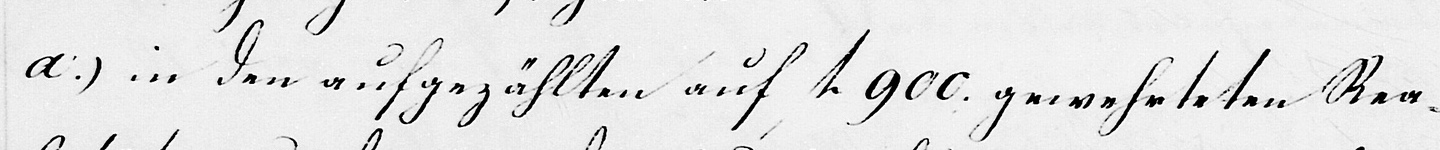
a.) in den aufgezählten auf fl 900. gewehrteten Rea¬
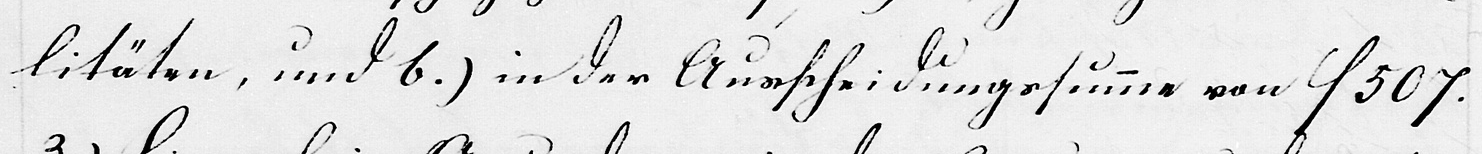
litäten, und b.) in der Ausscheidungssumme von f 507.
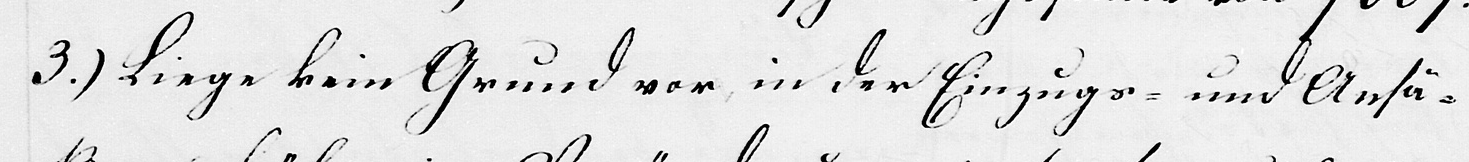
3.) Liege kein Grund vor in der Einzugs- und Ansä¬
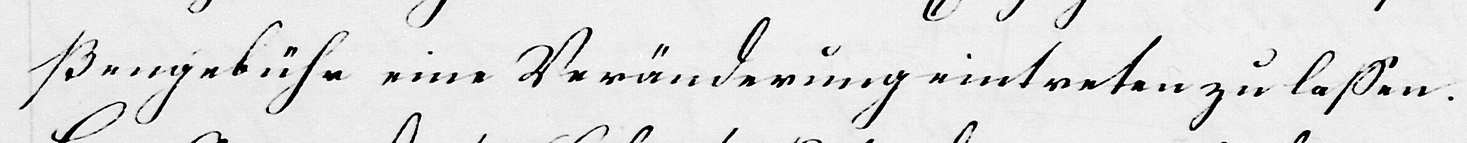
ßengebühr eine Veränderung eintreten zu laßen.
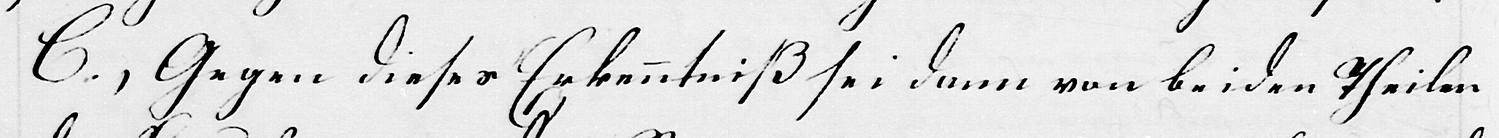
C., Gegen dieses Erkenntniß sei dann von beiden Theilen
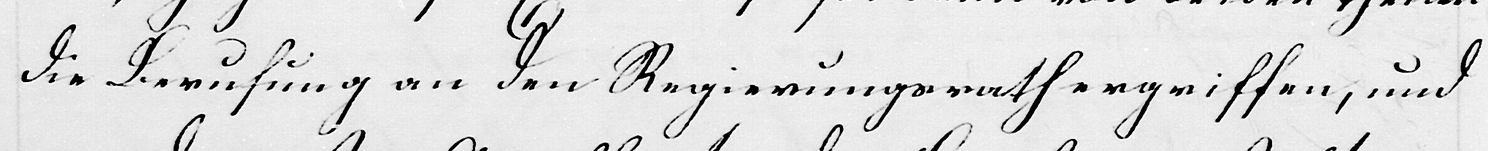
die Berufung an den Regierungsrath ergriffen, und
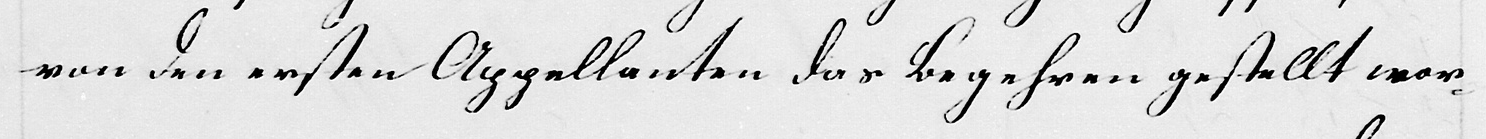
von den ersten Appellanten das Begehren gestellt wor-
